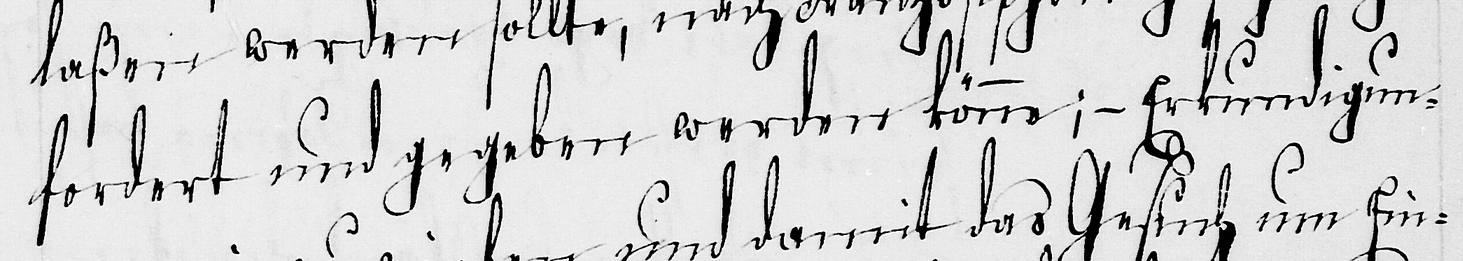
fordert und gegeben werden könne; – Erkundigun¬
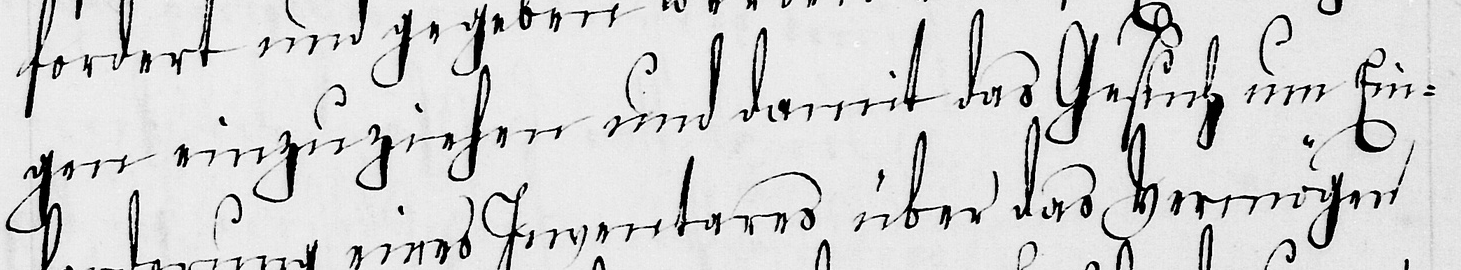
gen einzuziehen und damit das Gesuch um Ein¬
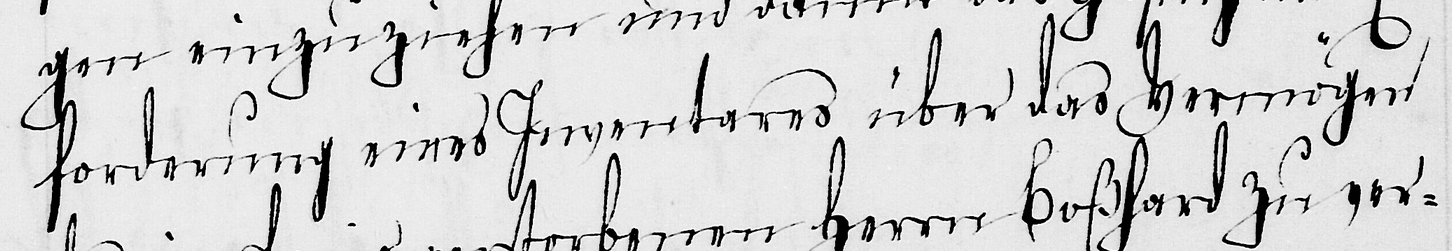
forderung eines Inventares über das Vermögen
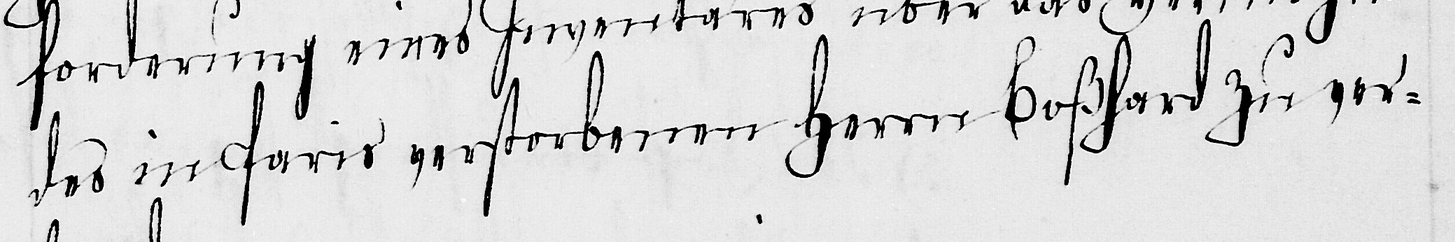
des in Paris verstorbenen Herrn Boßhard zu ver¬
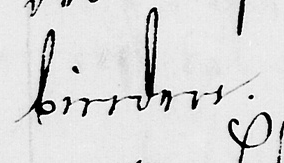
binden.
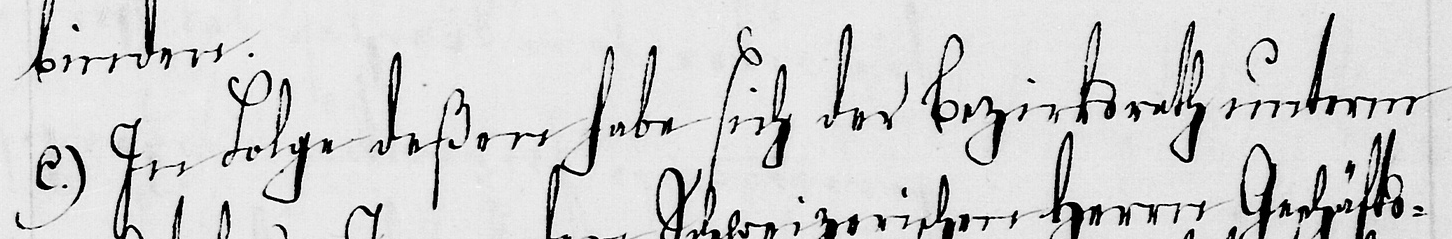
C.) In Folge deßen habe sich der Bezirksrath unterm
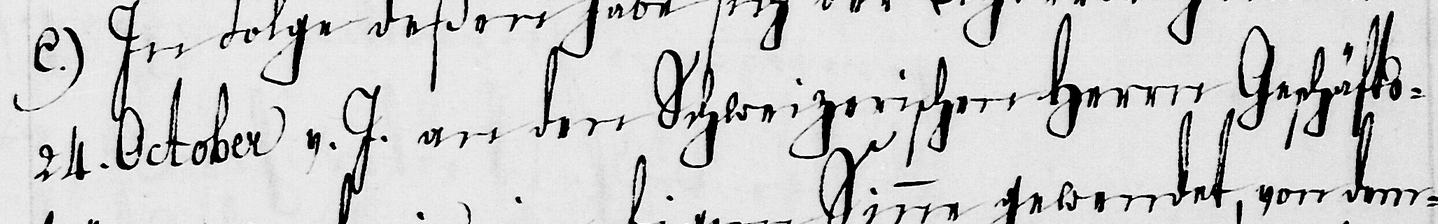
24. October v. J. an den Schweizerischen Herrn Geschäfts¬
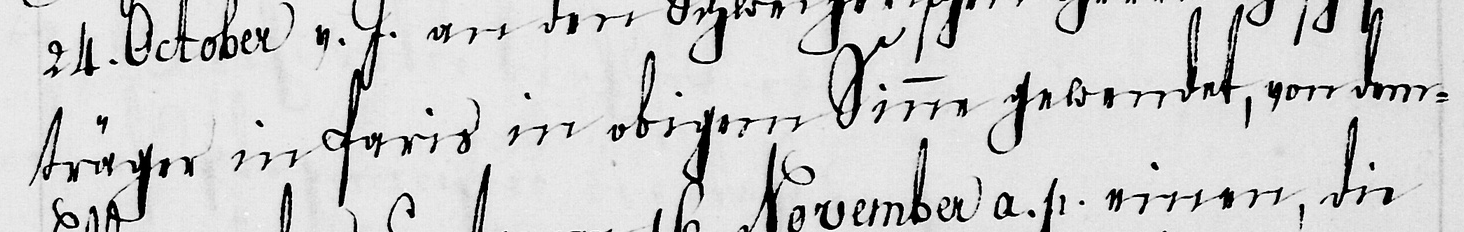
träger in Paris in obigem Sinne gewendet, von dem¬
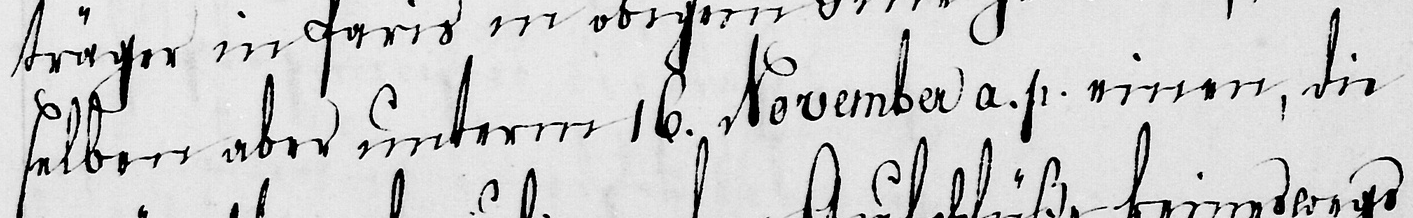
selben aber unterm 16. November a. p. einen, die
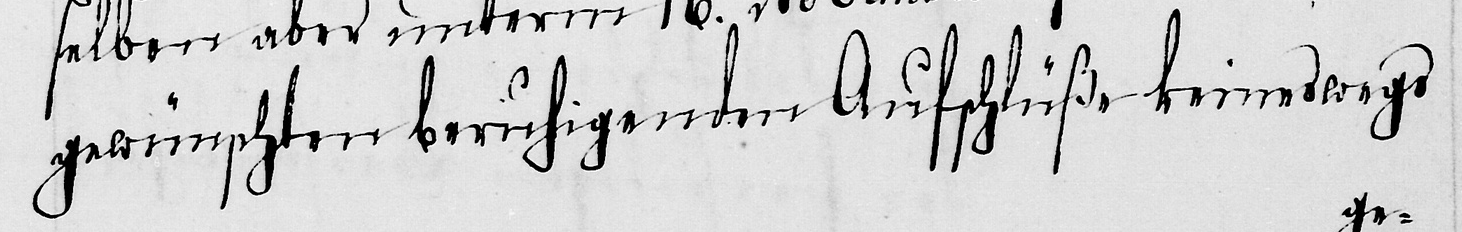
gewünschten beruhigenden Aufschlüße keineswegs
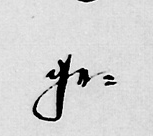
ge¬
